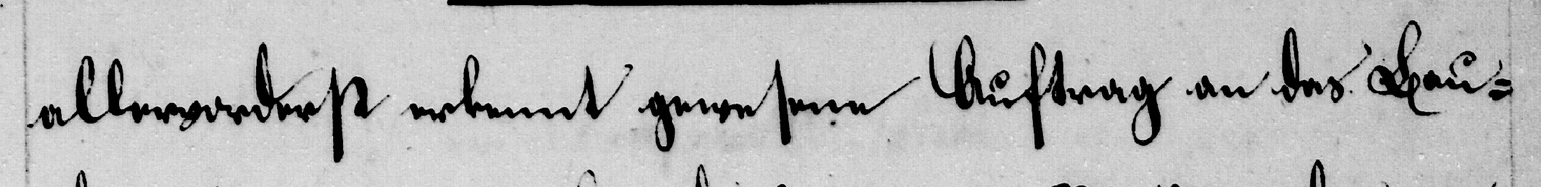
allervorderst erkennt gewesene Auftrag an das Bau¬
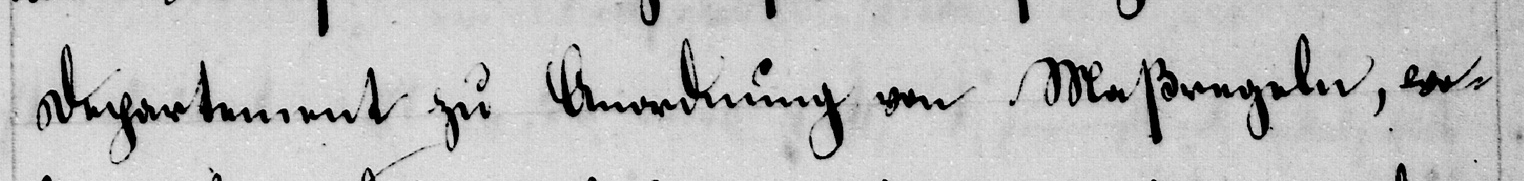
departement zu Anordnung von Maßregeln, wo¬
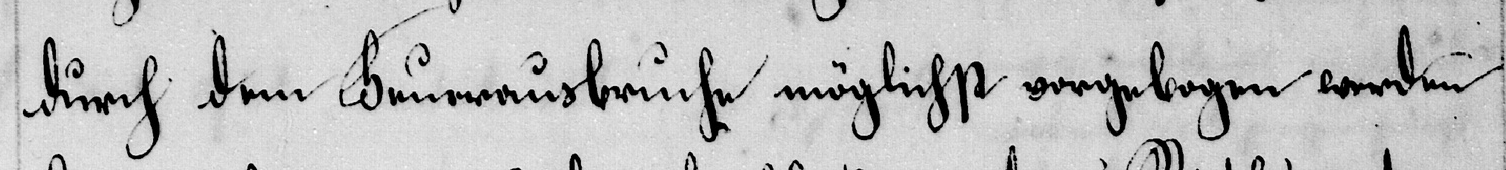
durch dem Feuerausbruche möglichst vorgebogen werden
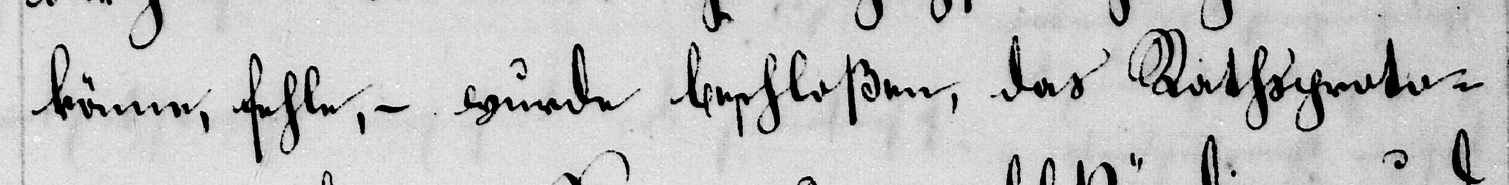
könne, fehle, – wurde beschloßen, das Rathsproto¬
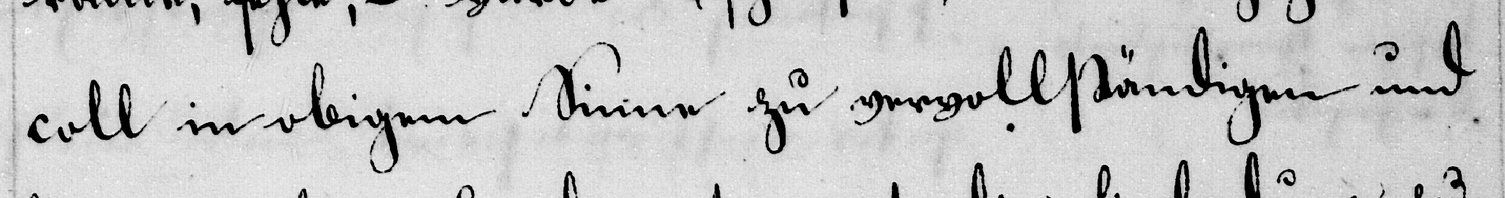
coll in obigem Sinne zu vervollständigen und
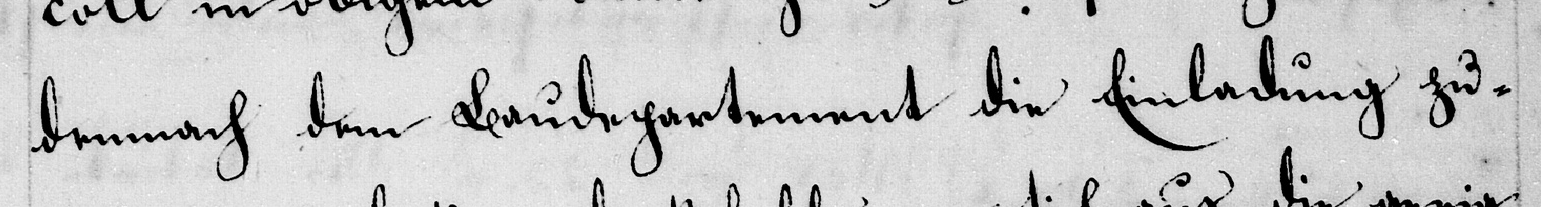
demnach dem Baudepartement die Einladung zu¬
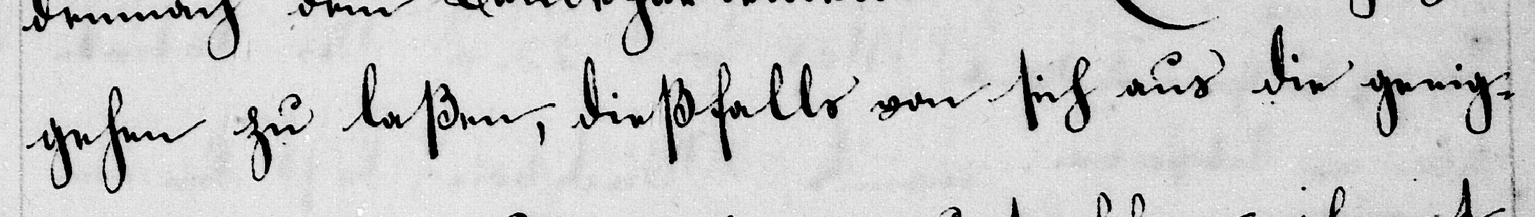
gehen zu laßen, dießfalls von sich aus die geeig¬
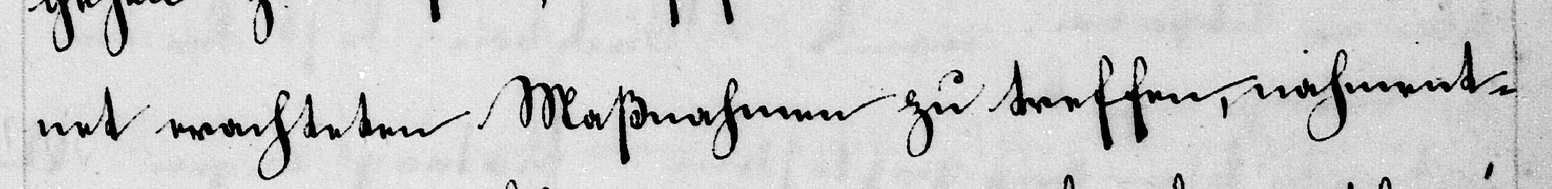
net erachteten Maßnahmen zu treffen, nahment¬
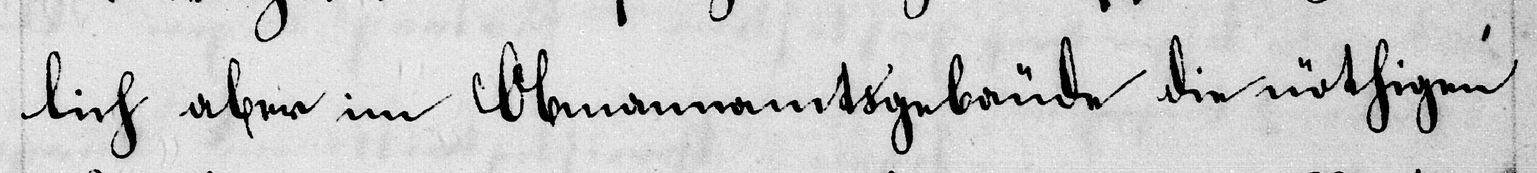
lich aber im Obmannamtsgebäude die nöthigen
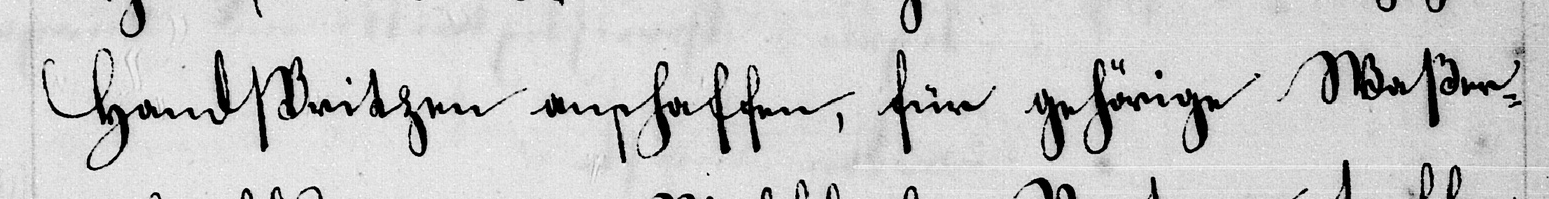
Handspritzen anschaffen, für gehörige Waßer¬
